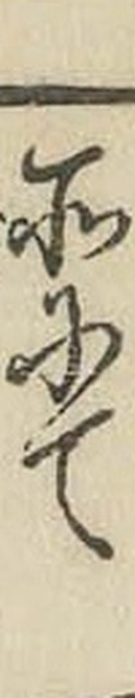所にて
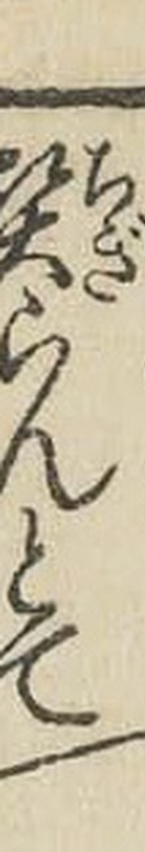契らんとて
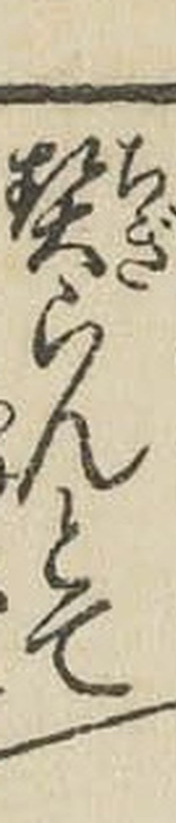契らんとて
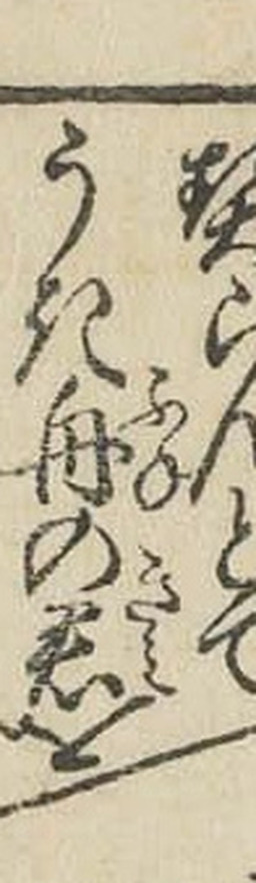うき舟の君を
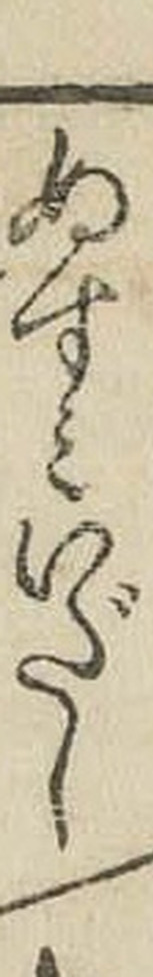ぬすみいだし
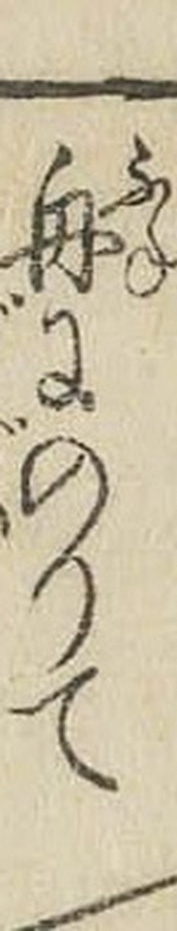舟にのりて
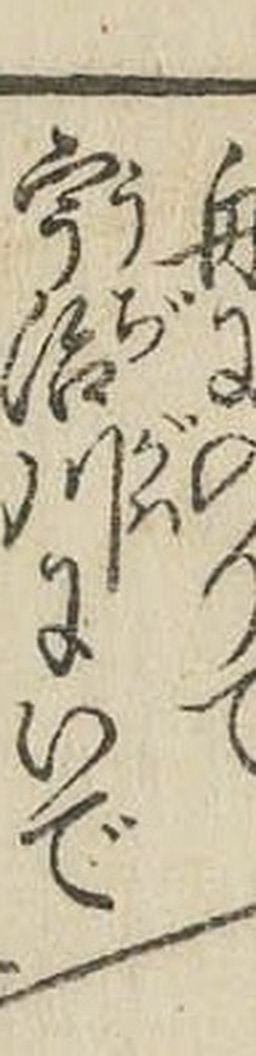宇治川にいで
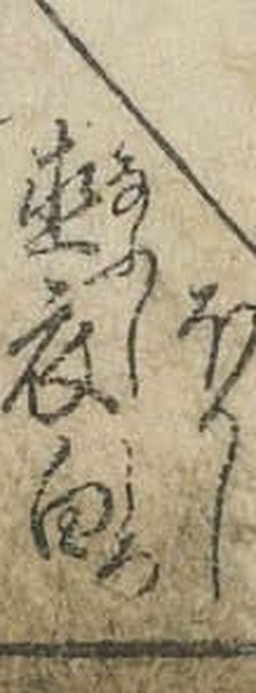直衣白
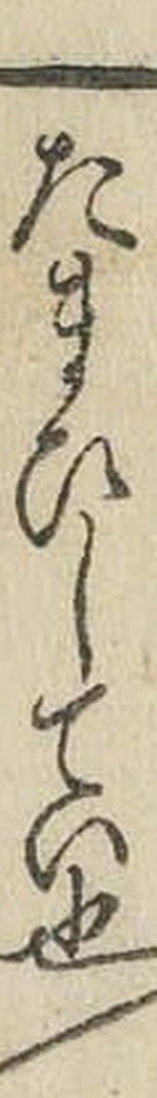たまひしてい也
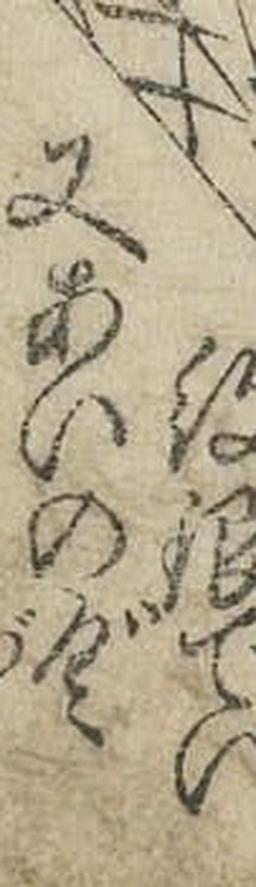又あいのぐ
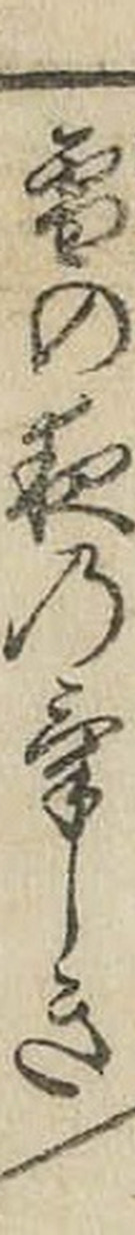雪の夜のけしき
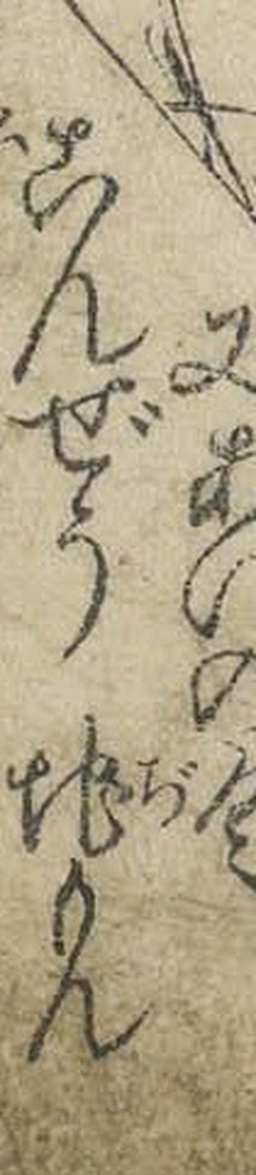こんぜう地もん
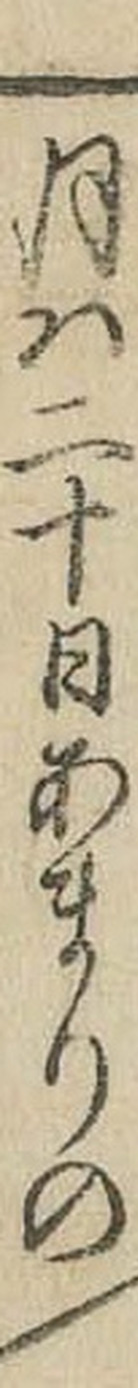月は二十日あまりの
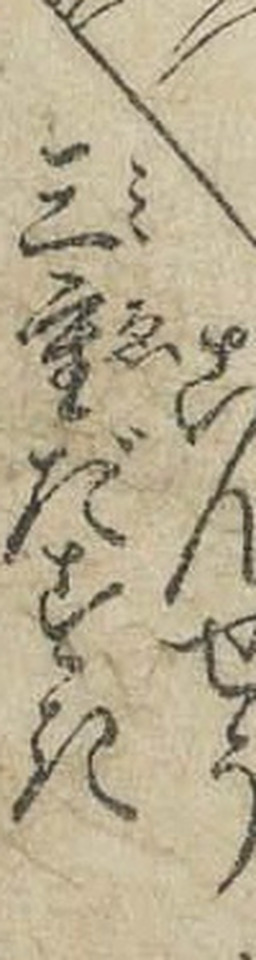三重だすき
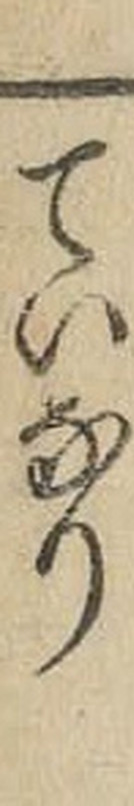ていなり
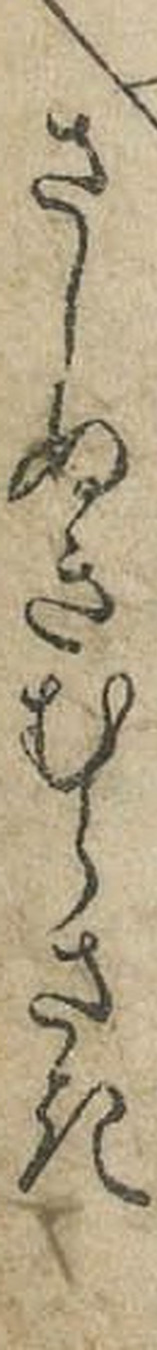さしぬきむらさき
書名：絵本写宝袋 9巻 1之巻
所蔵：東京学芸大学教育コンテンツアーカイブ
